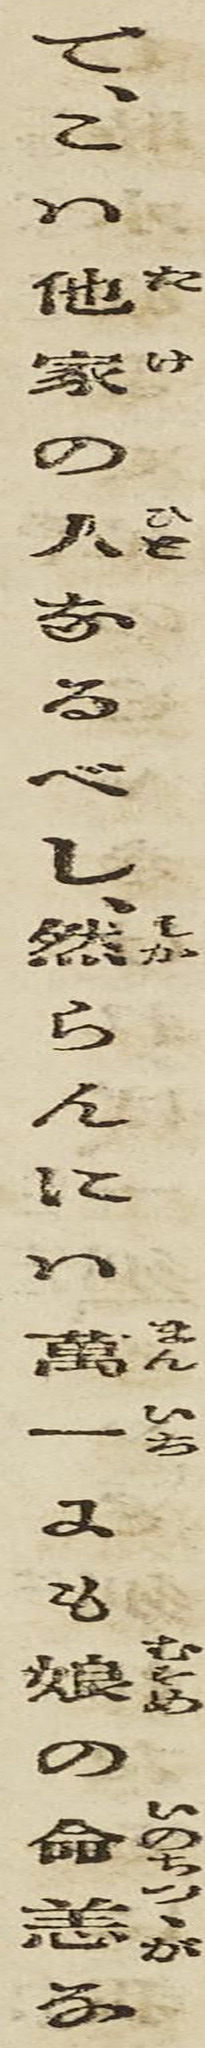で、こは他家の人なるべし、然らんには万一にも娘の命恙な
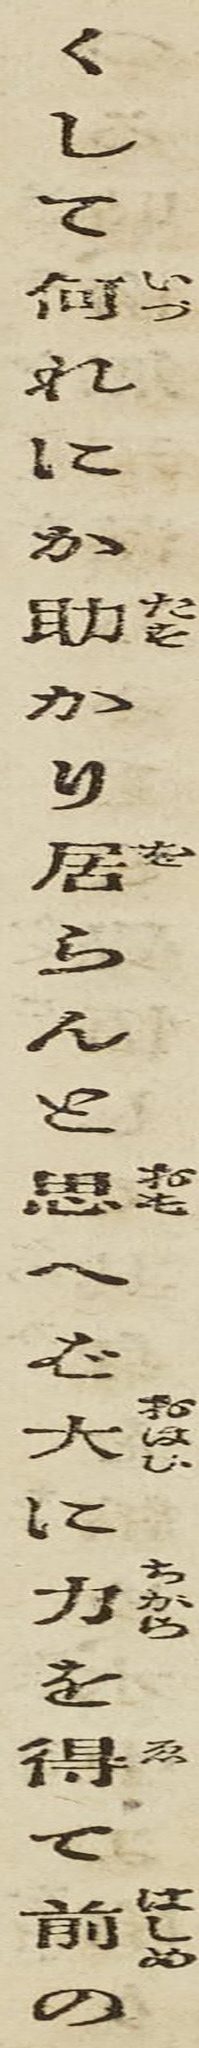くして何れにか助かり居らんと思へば大に力を得て前の
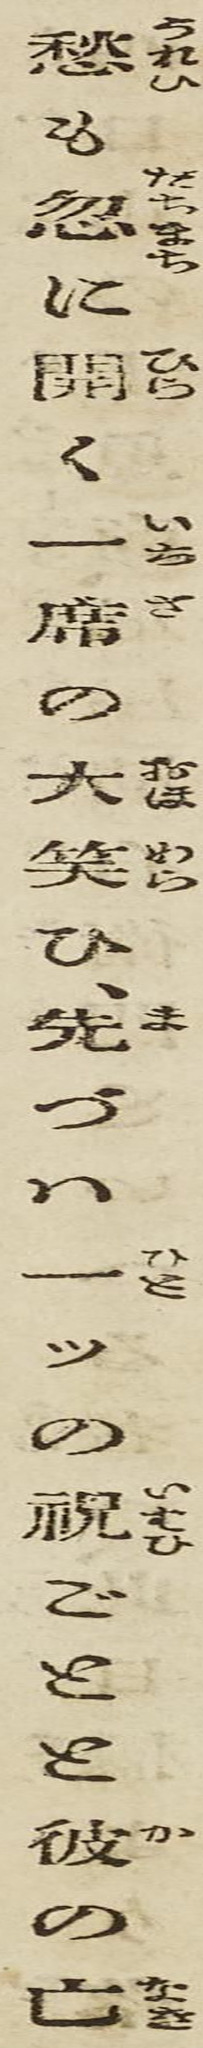愁も忽に開く一席の大笑い、先づは一ツの祝ごとと彼の亡
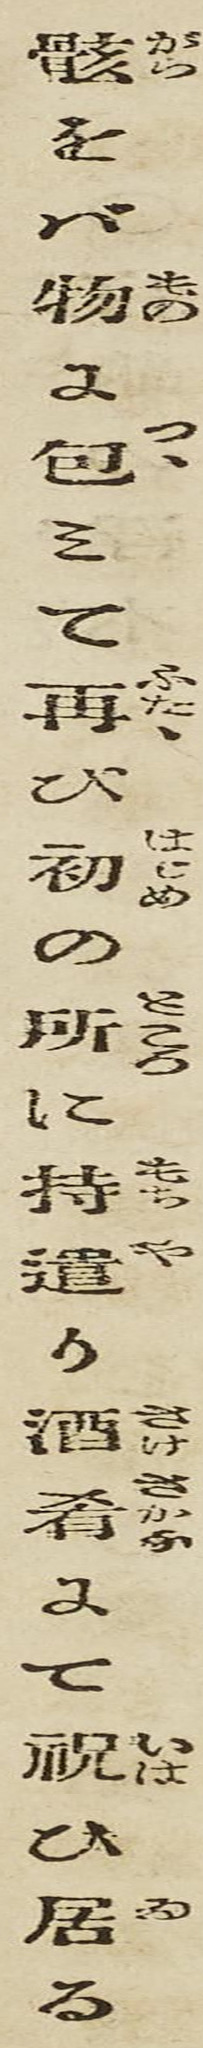骸をば物に包みて再び初の所に持遣り酒肴にて祝ひ居る
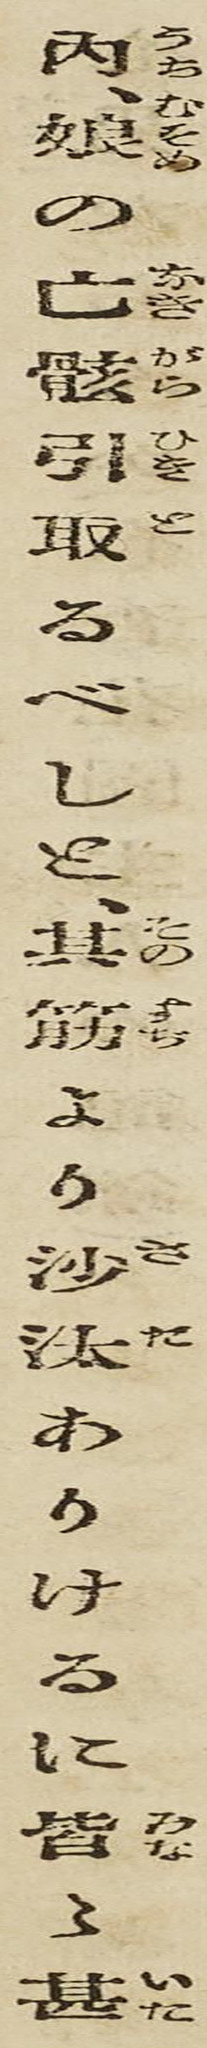内、娘の亡骸引取るべしと、其筋より沙汰ありけるに皆〻甚
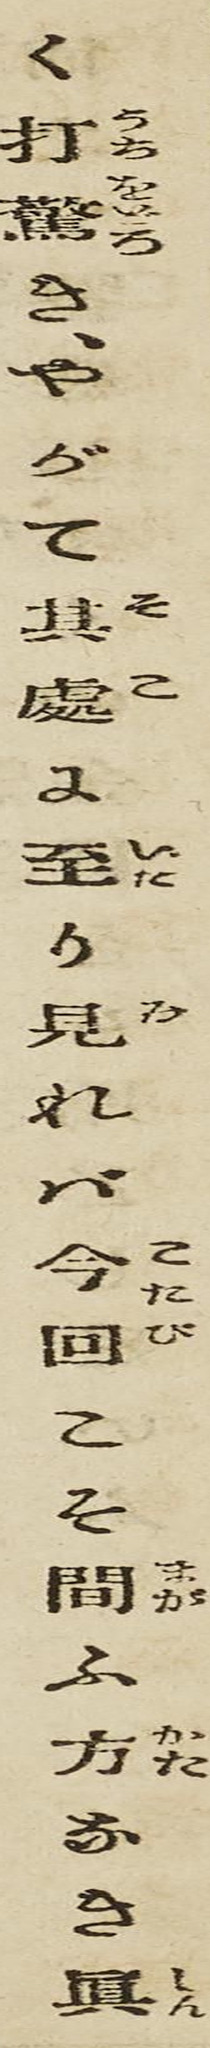く打驚き、やがて其処に至り見れば今回こそ間ふ方なき真
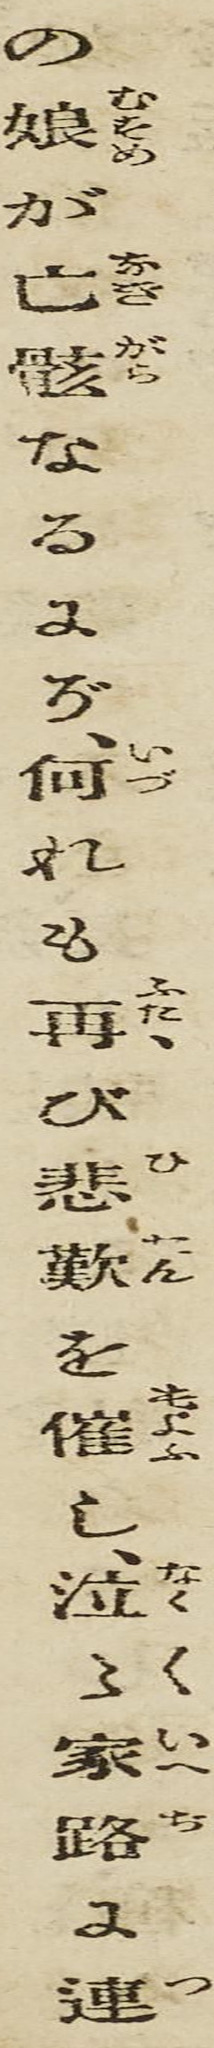の娘が亡骸なるにぞ、何れも再び悲嘆を催し、泣〻家路に連
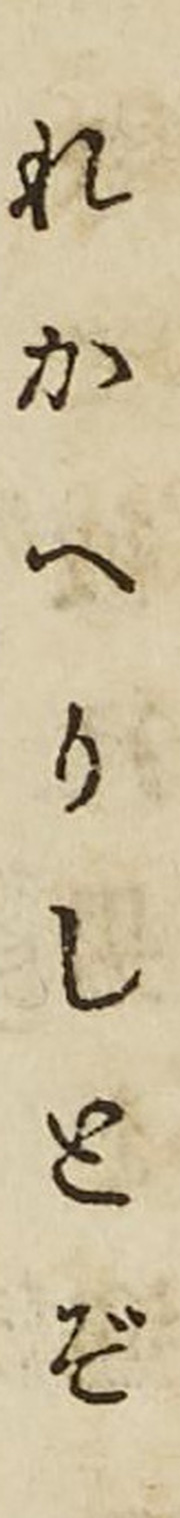れかへりしとぞ
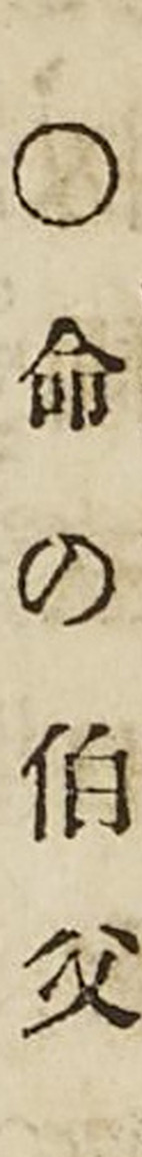○命の伯父
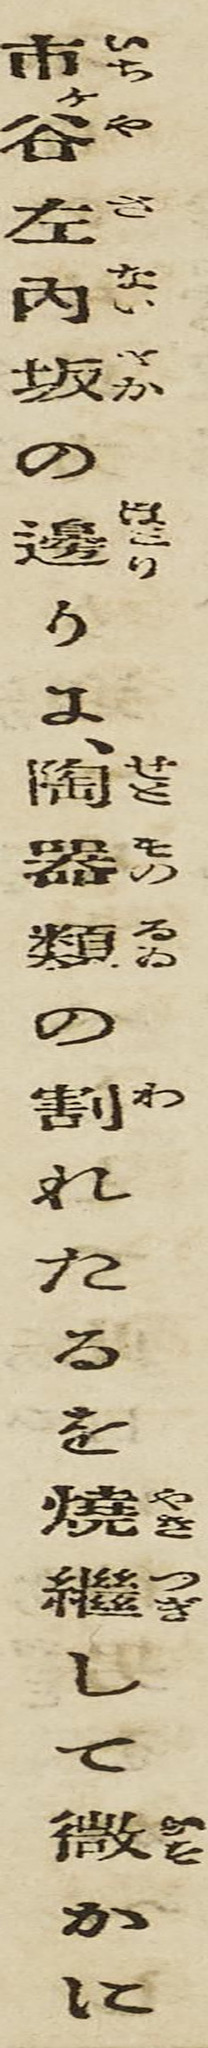市ヶ谷佐内坂の辺りに、陶器類の割れたるを焼継して微かに
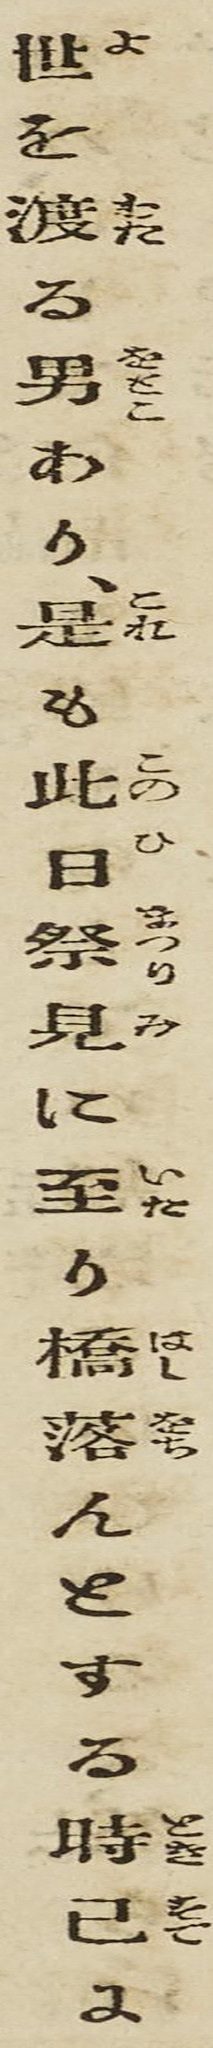世を渡る男あり、是も此日祭見に至り橋落んとする時已に
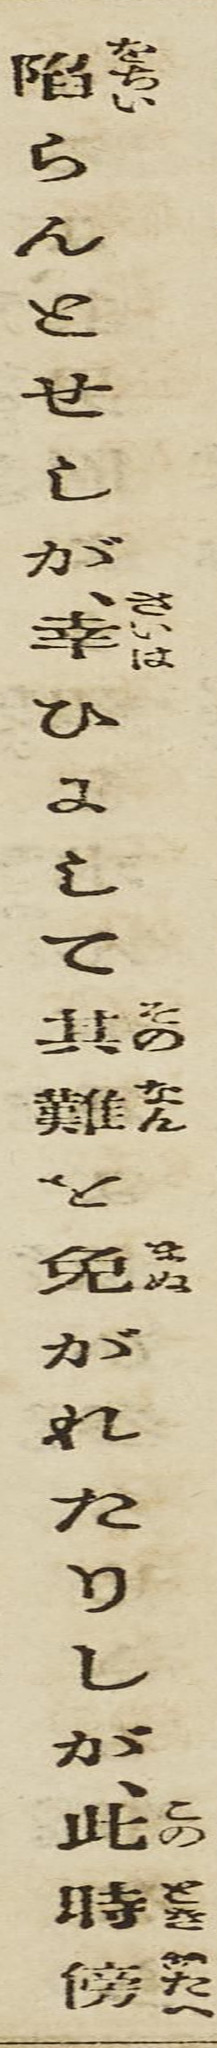陥らんとせしが、幸ひにして其難を免がれたりしが、此時傍
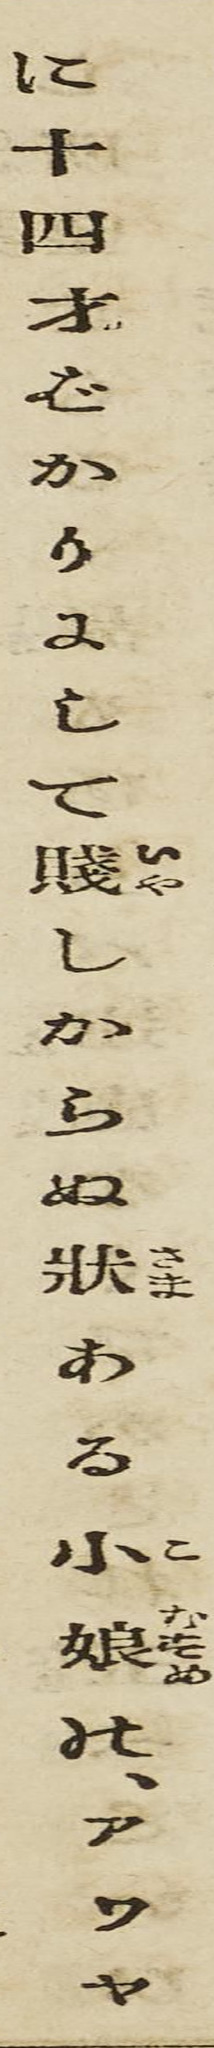に十四才ばかりにして賎しからぬ状ある小娘の、アワヤ
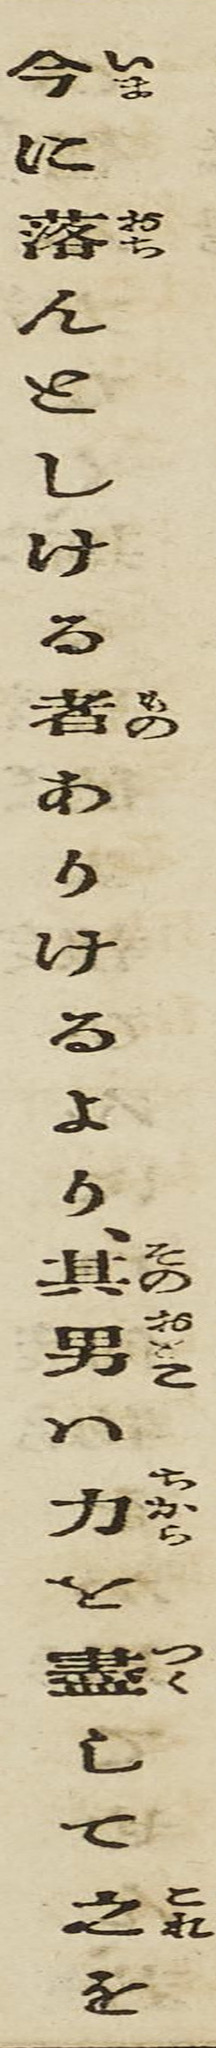今に落んとしける者ありけるより、其男は力を尽して之を
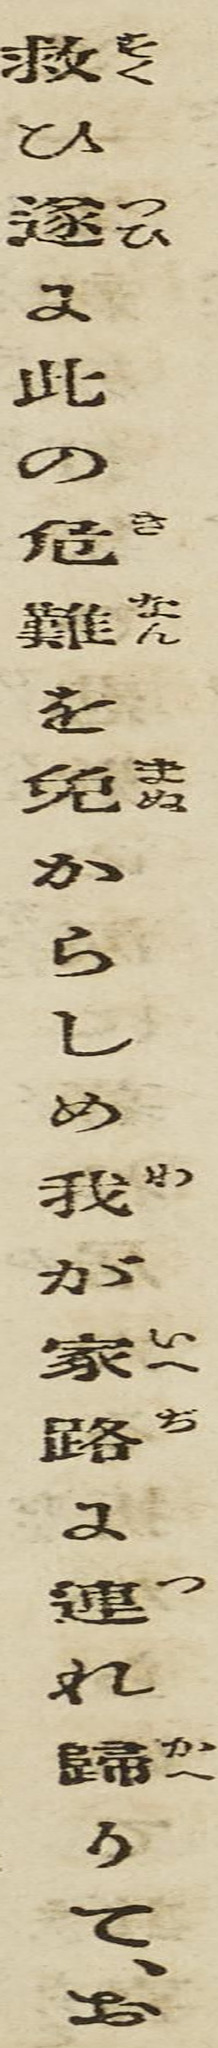救ひ遂に此の危難を免からしめ我が家路に連れ帰りて、お
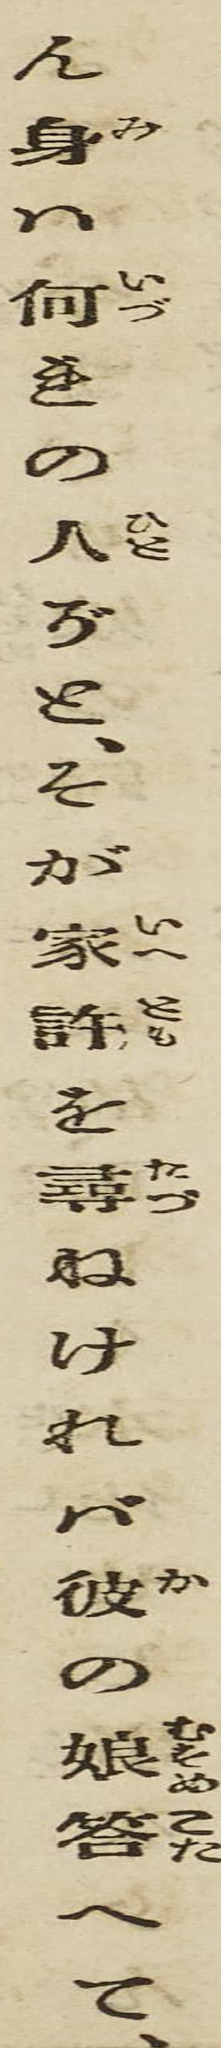ん身は何れの人ぞと、そが家許を尋ねければ彼の娘答へて、
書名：永代惨話　文化の夢　全
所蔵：東京大学地震研究所図書室 Earthquake Research Institute Library, The University of Tokyo, JAPAN
